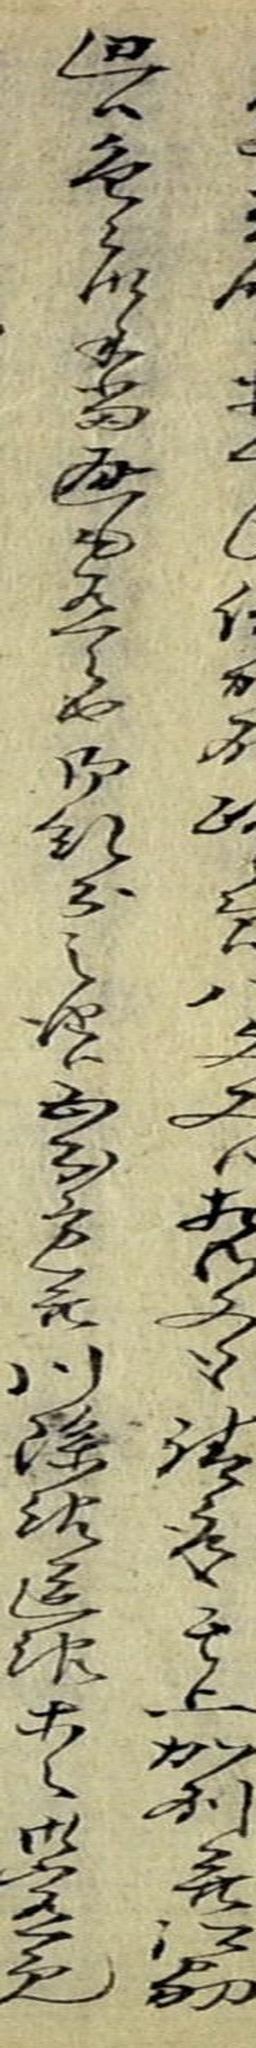辺は色々御手当通も有之由御領分之儀は五分方并川除銀道銀等之御宥免
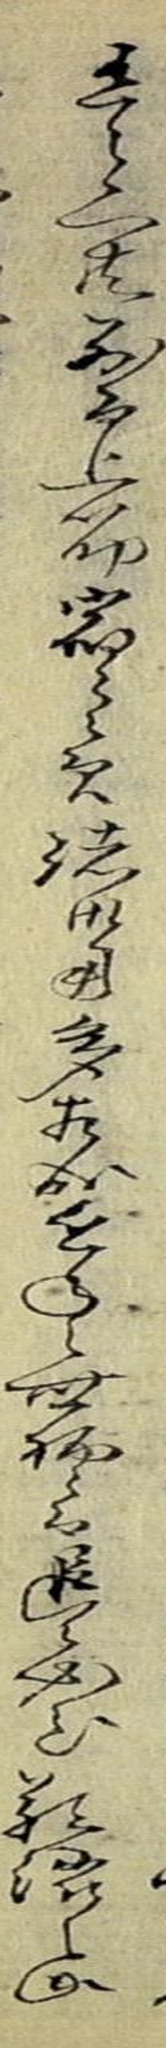有之候へ共別而上筋宿々に而は諸御用多相成近年之世柄に而追々必至難渋之趣
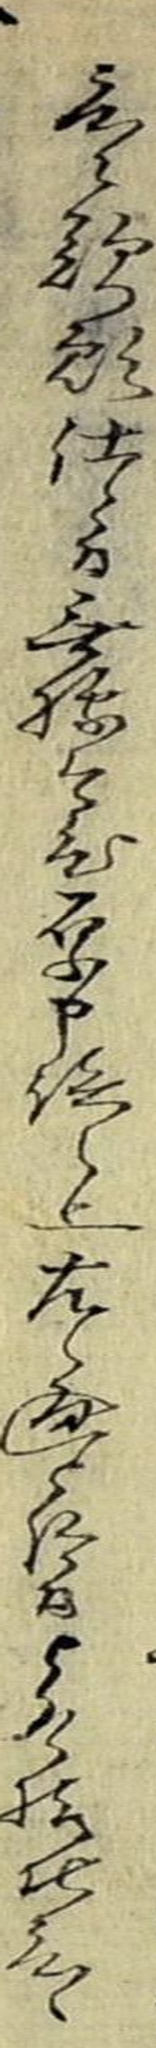度々歎願仕候に付無拠今度厚申談之上左之通被仰付被下候様仕度候
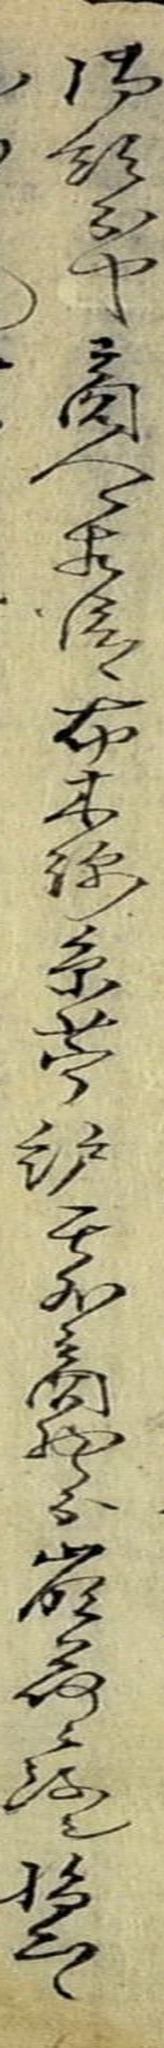一御領分中商人へ相渡候布木綿苧䋆其外商物之分崩荷に致し指出候
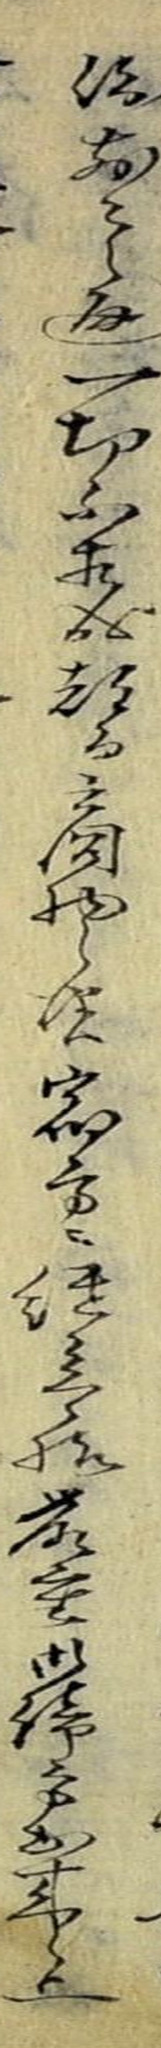儀前々之通一切不相成都而商物之儀宿方へ継立候様厳重御締方出来上
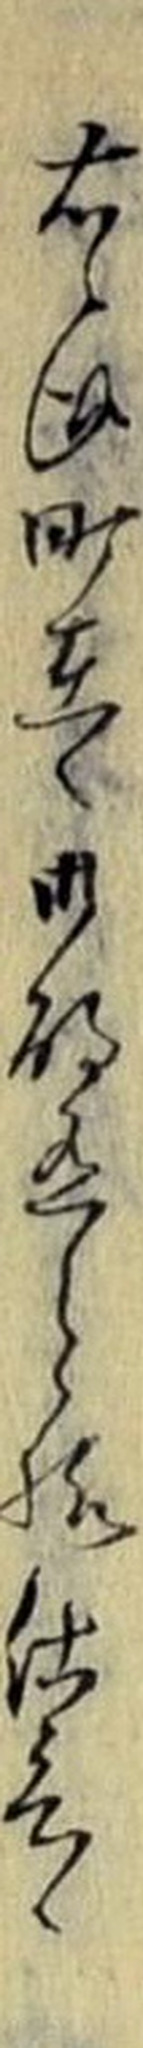右之趣町在へ御触有之候様仕度候
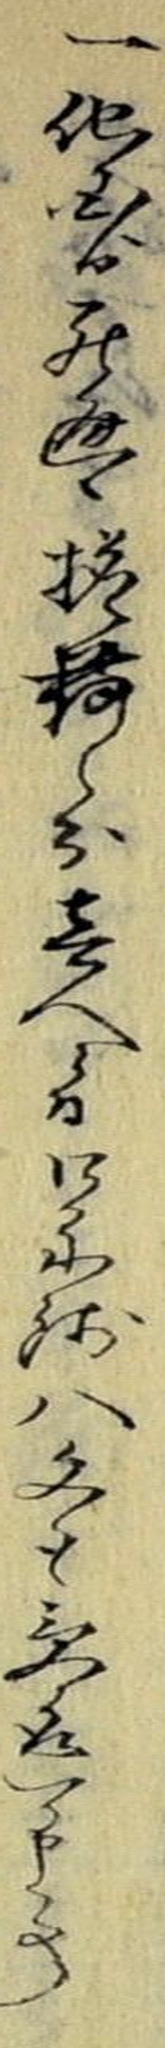一他国ゟ罷通候担荷之分壱人に付口永銭八文つゝ受取可申事
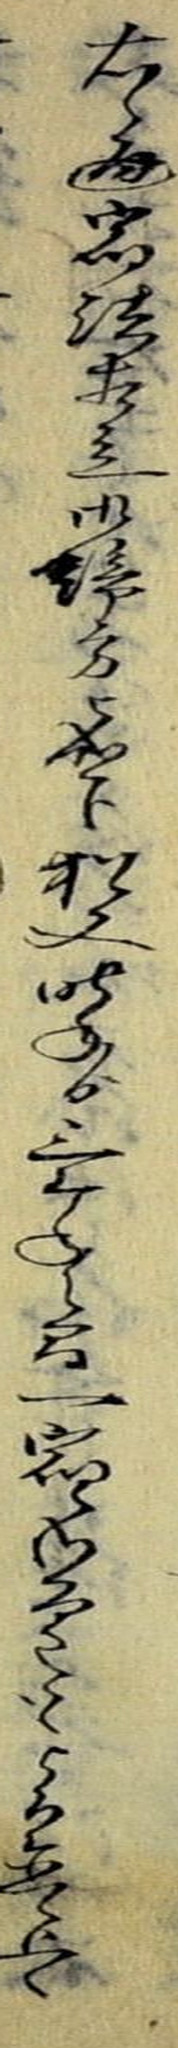右之通宿法相立御締方被成下猶又昨年ゟ三ヶ年之間一宿に弐百匁つヽ被下置上候
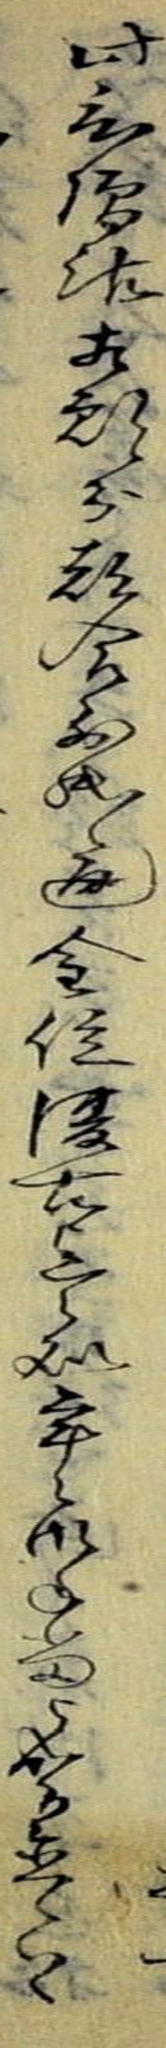此度増銀相願候分都合別紙之通金位復古迄之処年々御手当被成下置候はヽ
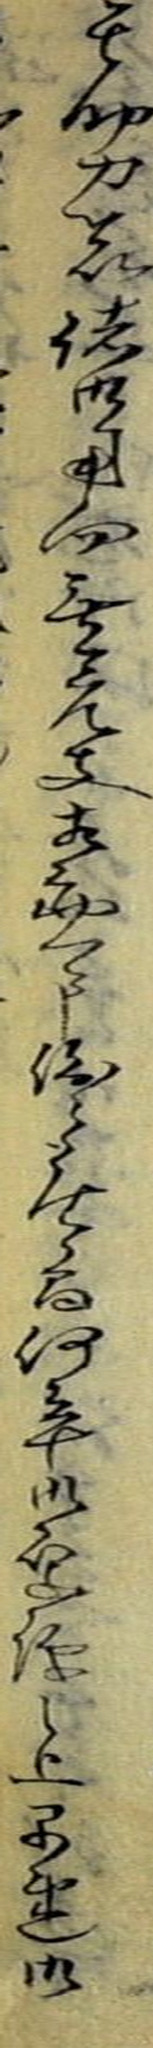其助力を以諸御用向無差支相勤可申儀に御座候間何卒御厚評之上早速御
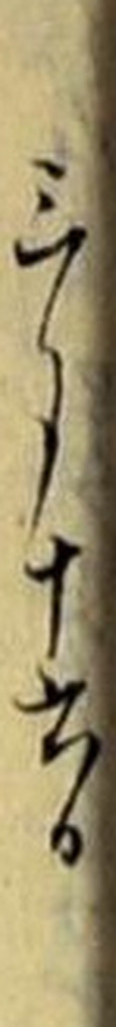三月十六日
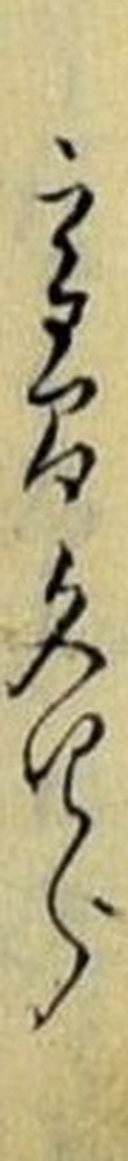高間久四郎
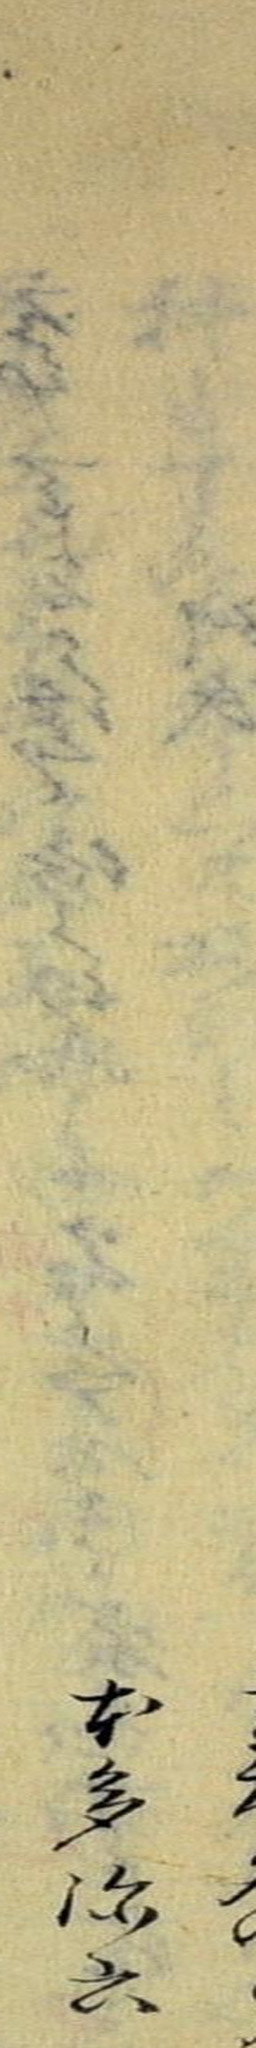本多弥六
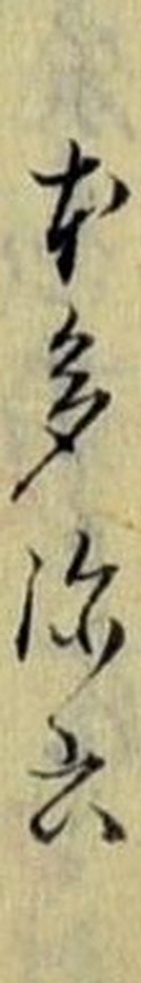本多弥六
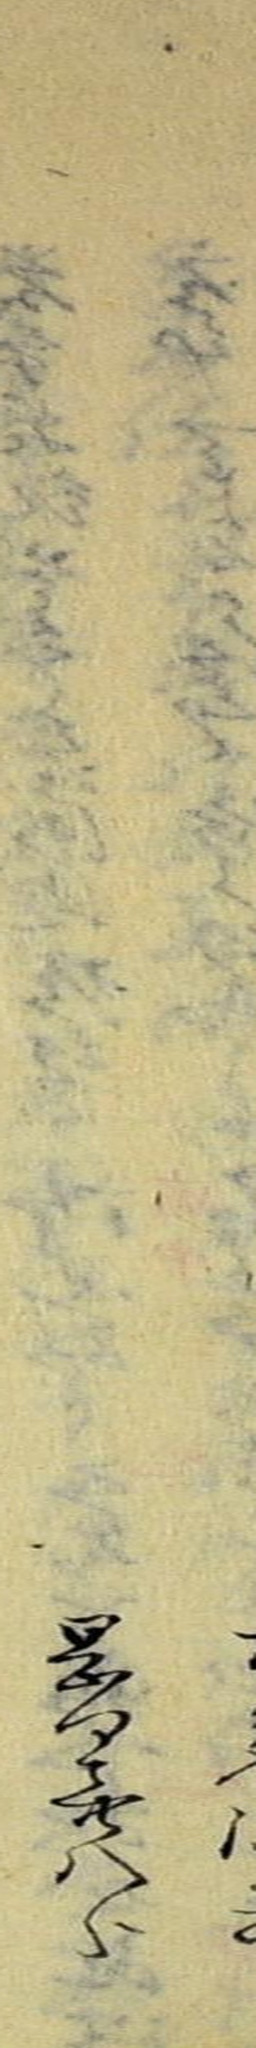岡田喜八郎
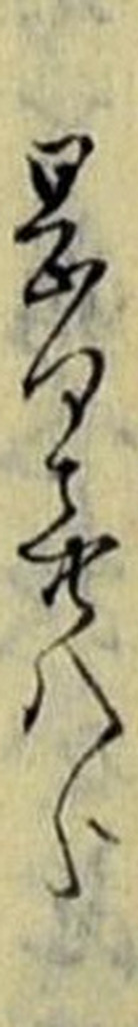岡田喜八郎
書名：命令之部 六
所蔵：福井県文書館 Fukui Prefectural Archives
